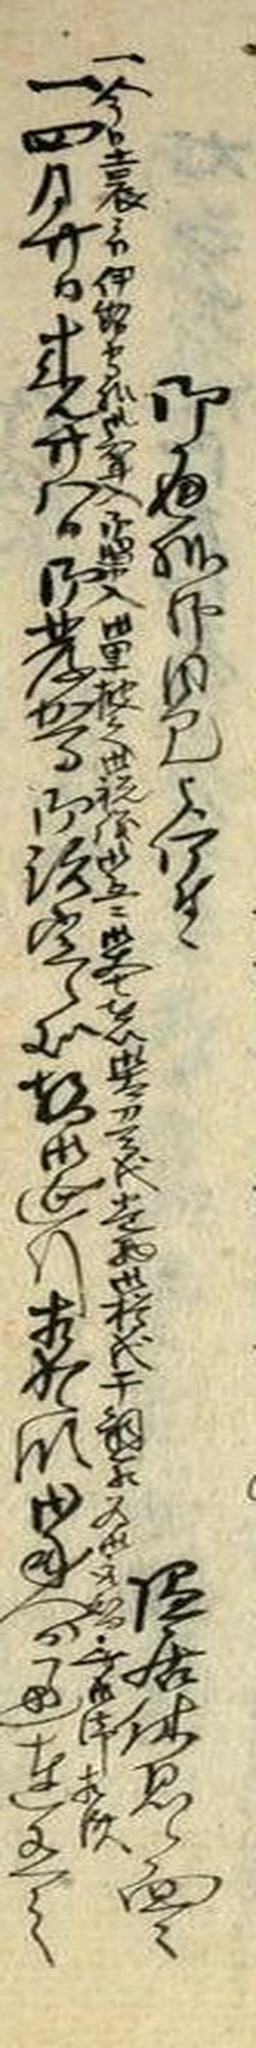一四月廿日来ル廿八日御発駕御治定之処暫御延引相成候段御用人ゟ通達有之
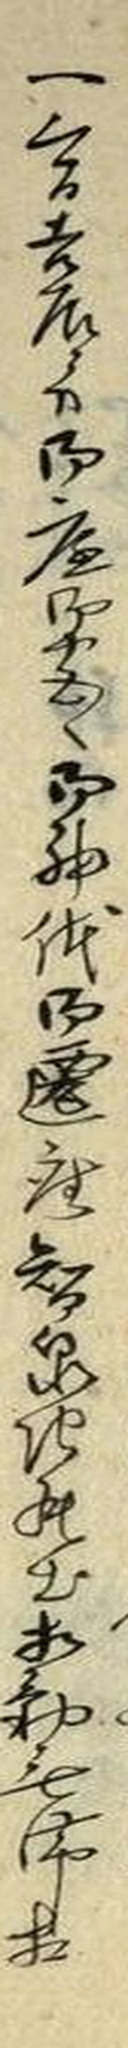一今日吉辰ニ付御庭御宮へ御神体御遷座智泉院罷出相勤無滞相
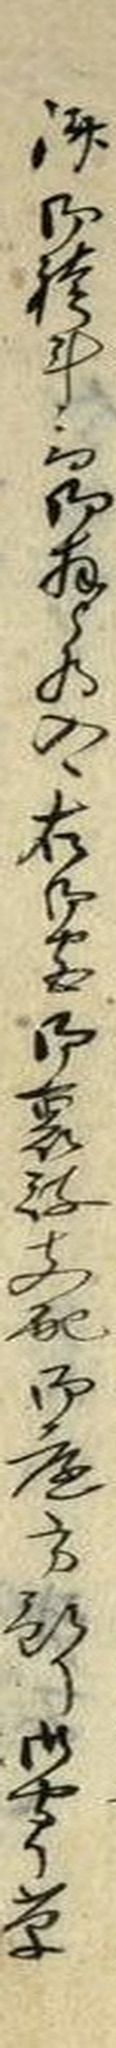済御袴斗ニ而御拝被為入候右御宮御裏役支配御庭方預り御守り草
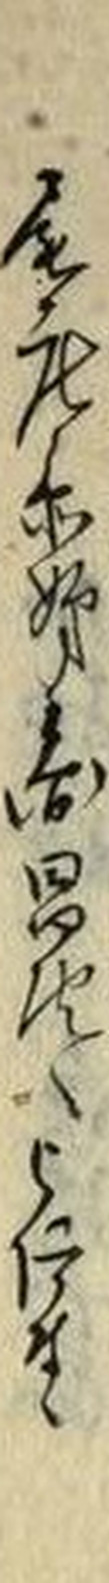尾庄兵衛姉円昌院へ被仰付候

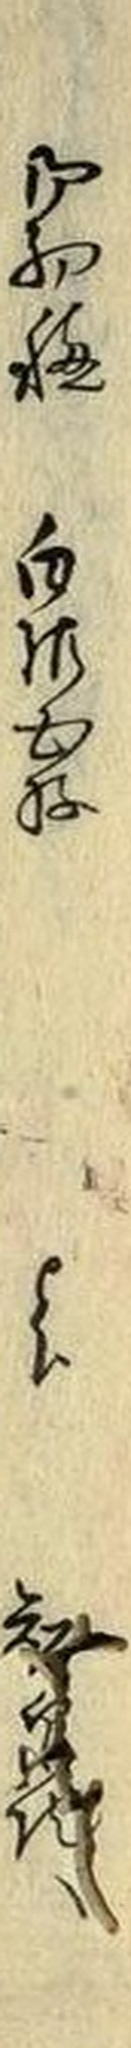御初穂白銀五枚被下智泉院へ
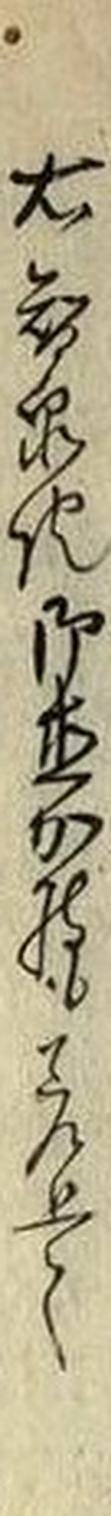右智泉院御直加持も差上之
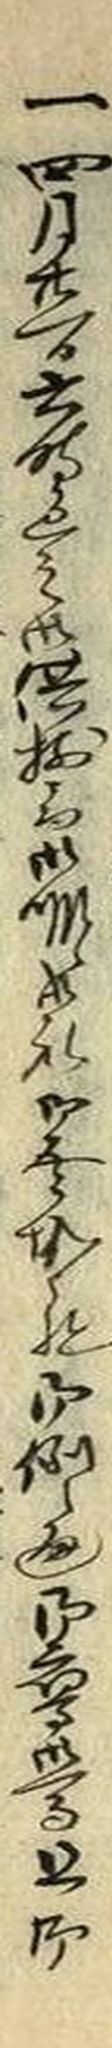一四月廿一日六時過之御供揃ニ而御暇御礼御登城被遊御例之通御鷹御馬且御
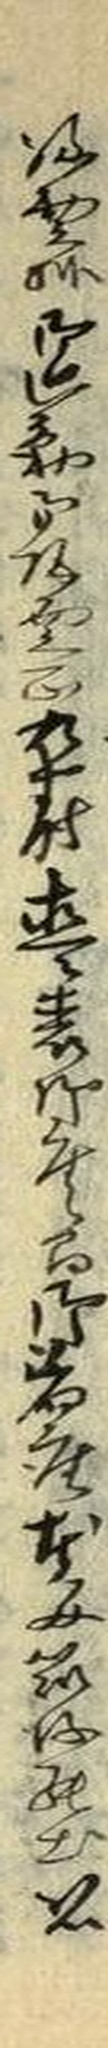帰殿掛御廻勤御帰殿正九半時直ニ表御座之間御着座本多筑後罷出恐
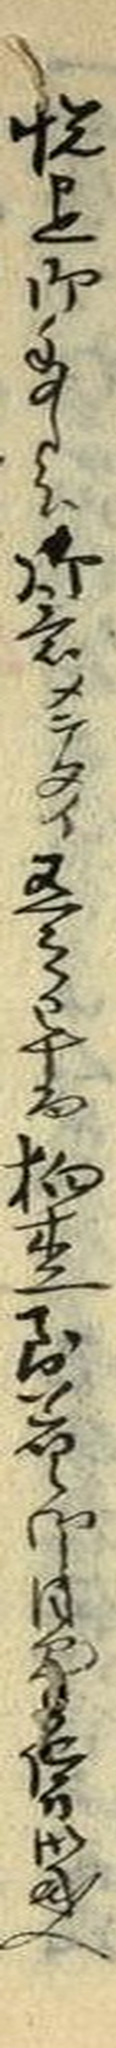悦申上御手のし被下御意メテタイ有之畢而狛杢到着之御目見被仰付御用人
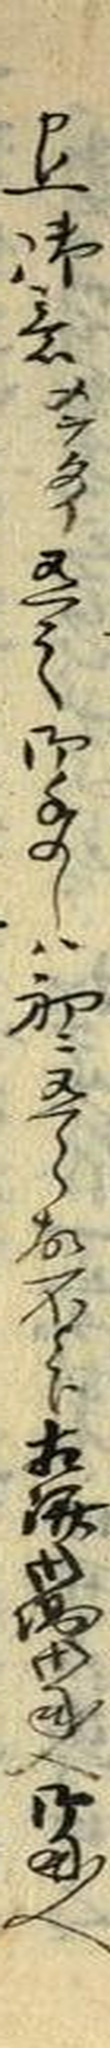申上御意メテタイ有之御手のしハ初ニ有之故不被下相済御側御用人御用人
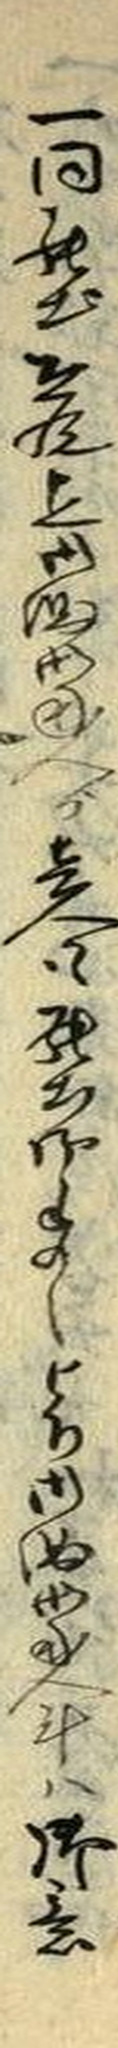一同罷出恐悦申上御側御用人ゟ壱人ツゝ罷出御手のし被下御側御用人斗ハ御意
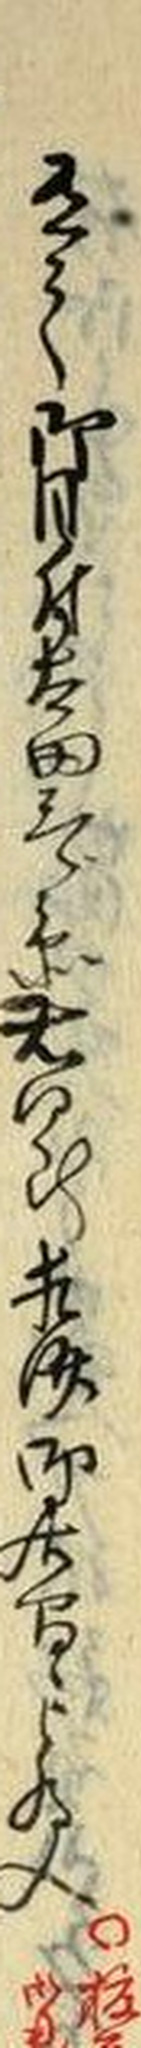有之御目付太田三郎兵衛右同断相済御居間へ被為入
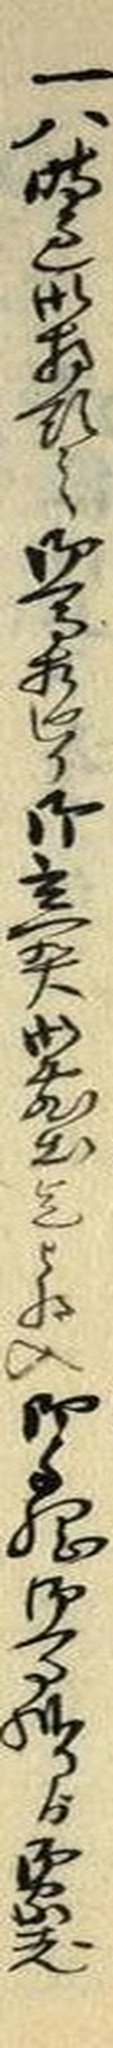一八時過御拝領之御馬相廻り御玄関御敷出迄被為入御手綱御馬掛りゟ御家老
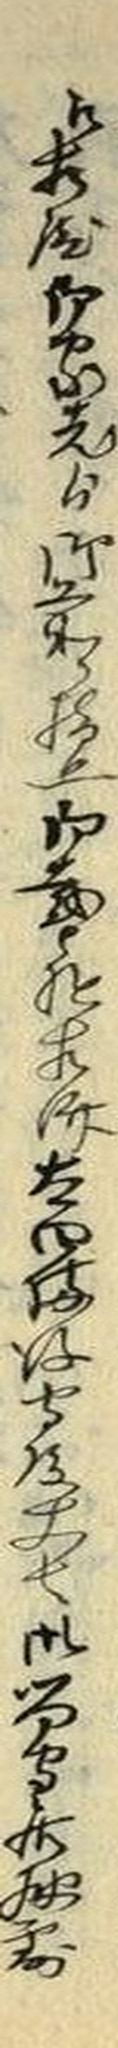江相渡御家老ゟ御前へ指上御戴被遊相済太田備後守殿使者御留守居披露
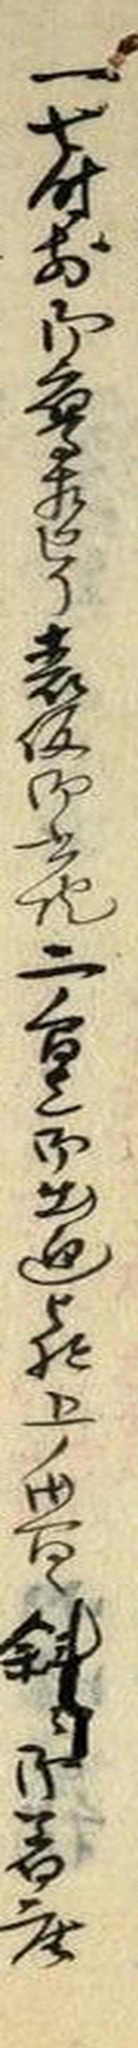一七時前御鷹相廻り表仮御書院二ノ間迄御出迎被遊上ノ御間へ斜ニ御着座
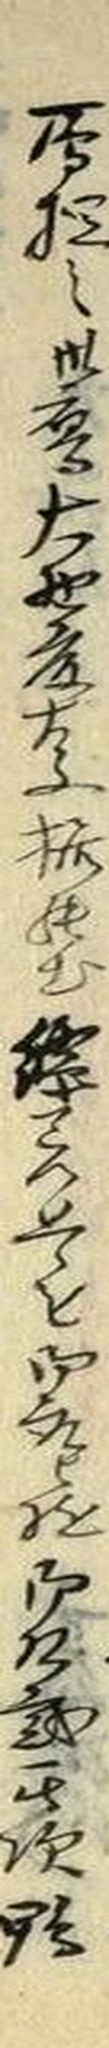鳫捉之御鷹大野藤太夫据罷出縛差上候を御取被遊御頂戴其次鴨
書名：少傅日録抄（斉善付側向頭取日記、江戸并道中、初入在国、逝去後…
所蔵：福井県文書館 Fukui Prefectural Archives
